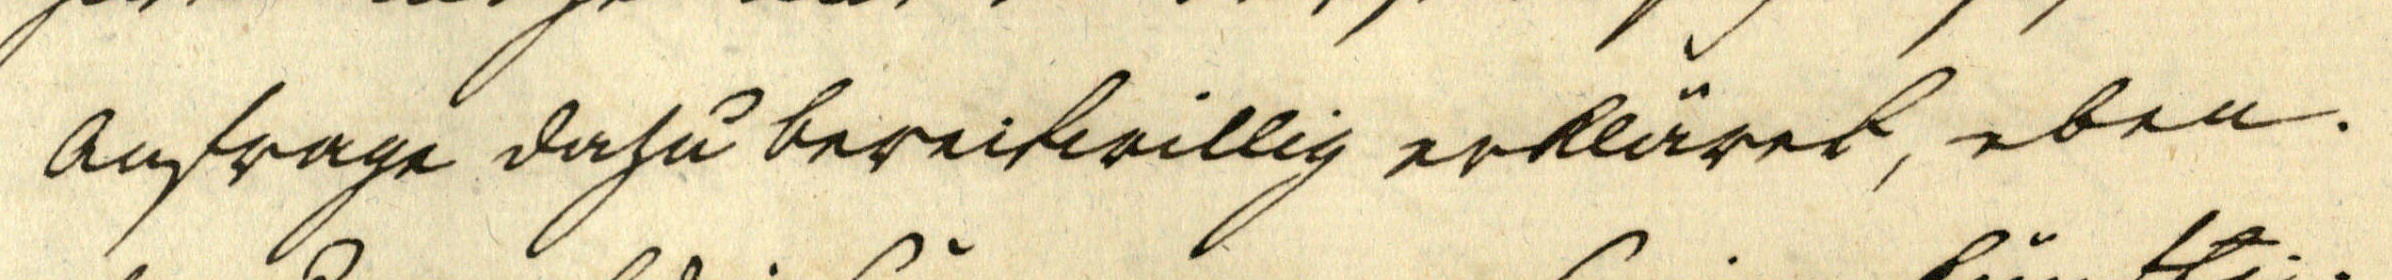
Anfrage dazu bereitwillig erkläret, eben¬
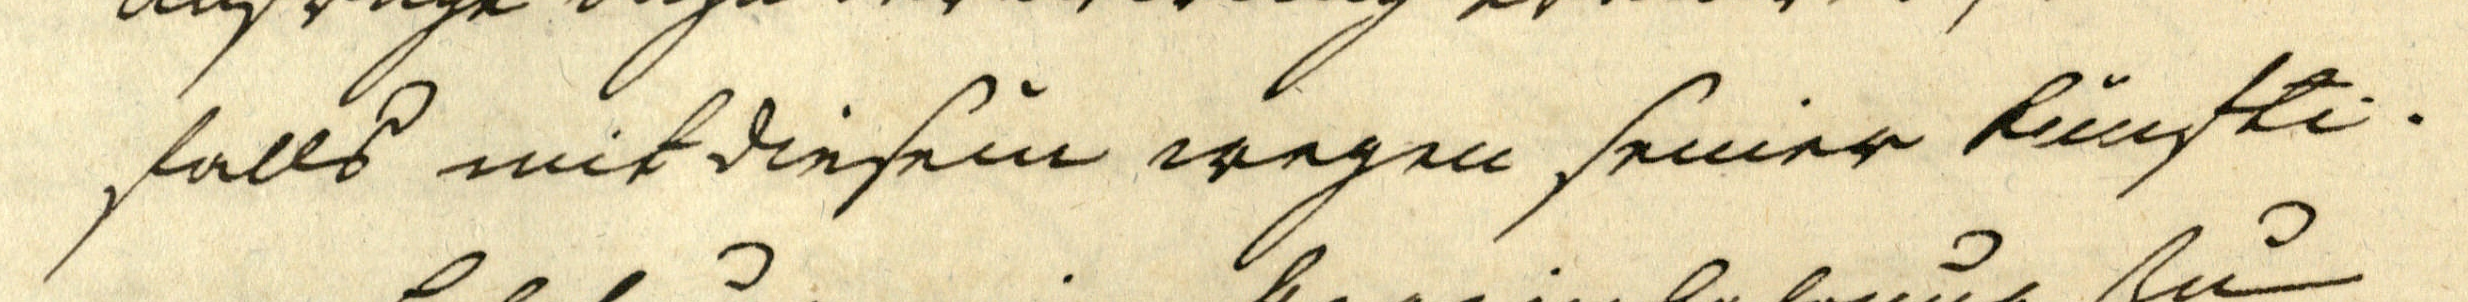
falls mit diesem wegen seiner künfti¬
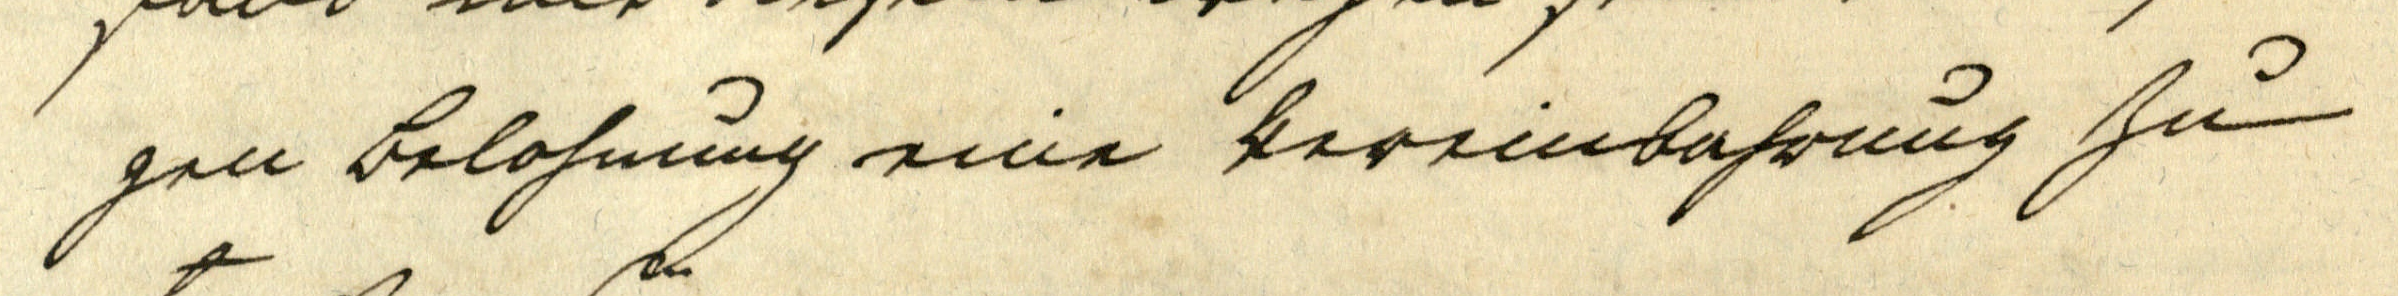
gen Belohnung eine Vereinbahrung zu
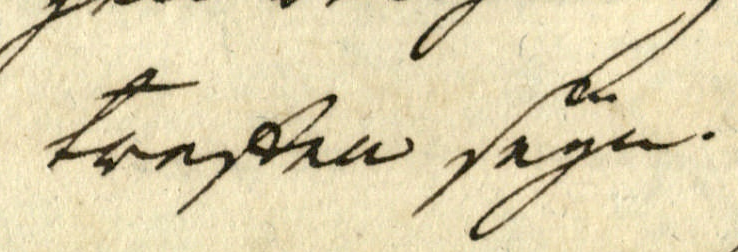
treffen seÿn.
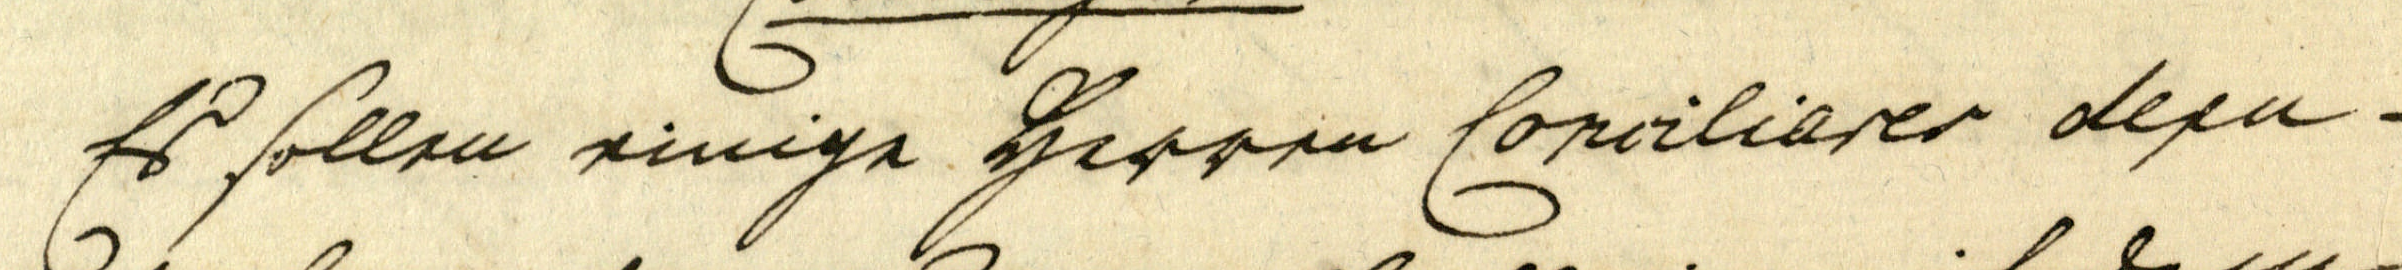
Es sollen einige Herren Conciliares depu¬
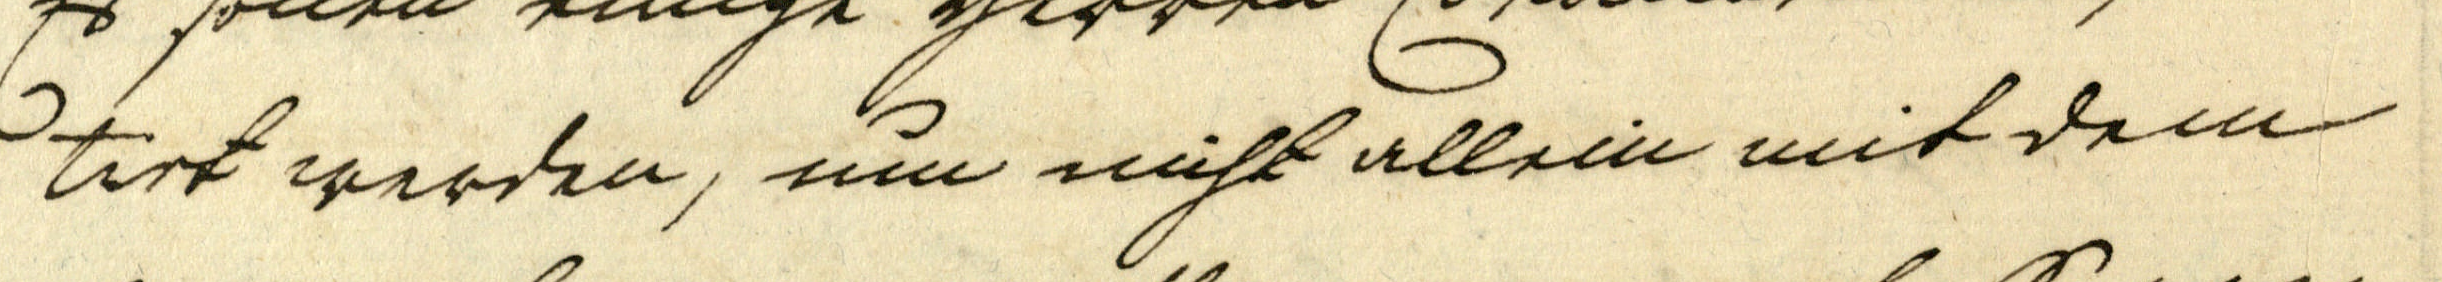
tirt werden, um nicht allein mit dem
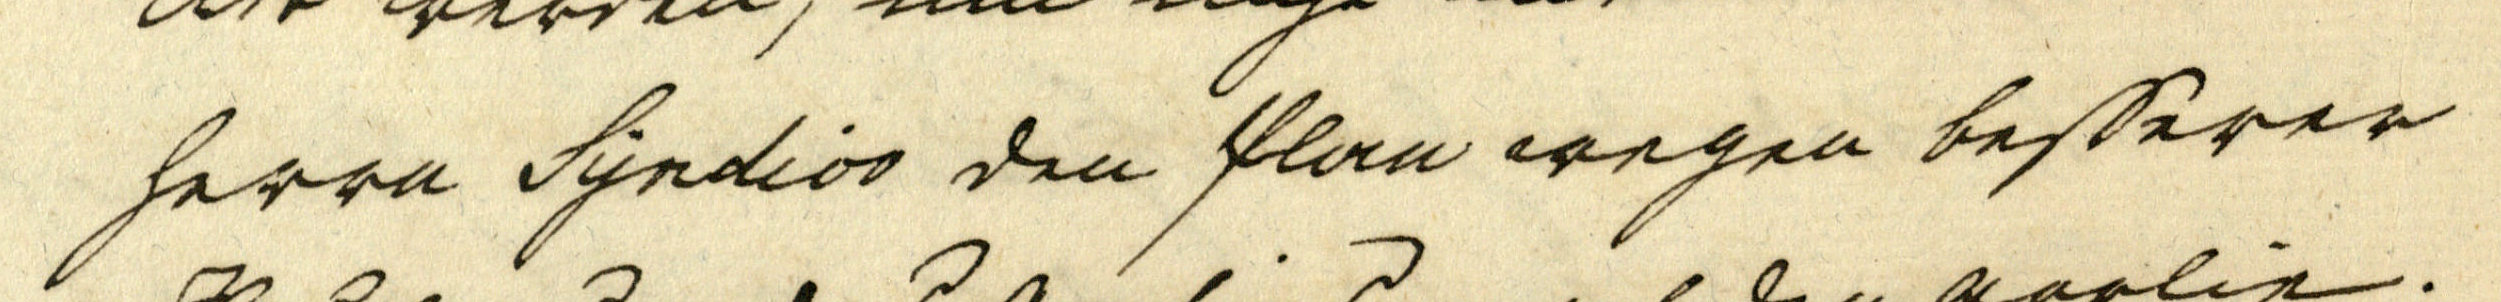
Herrn Sÿndico den Plan wegen besserer
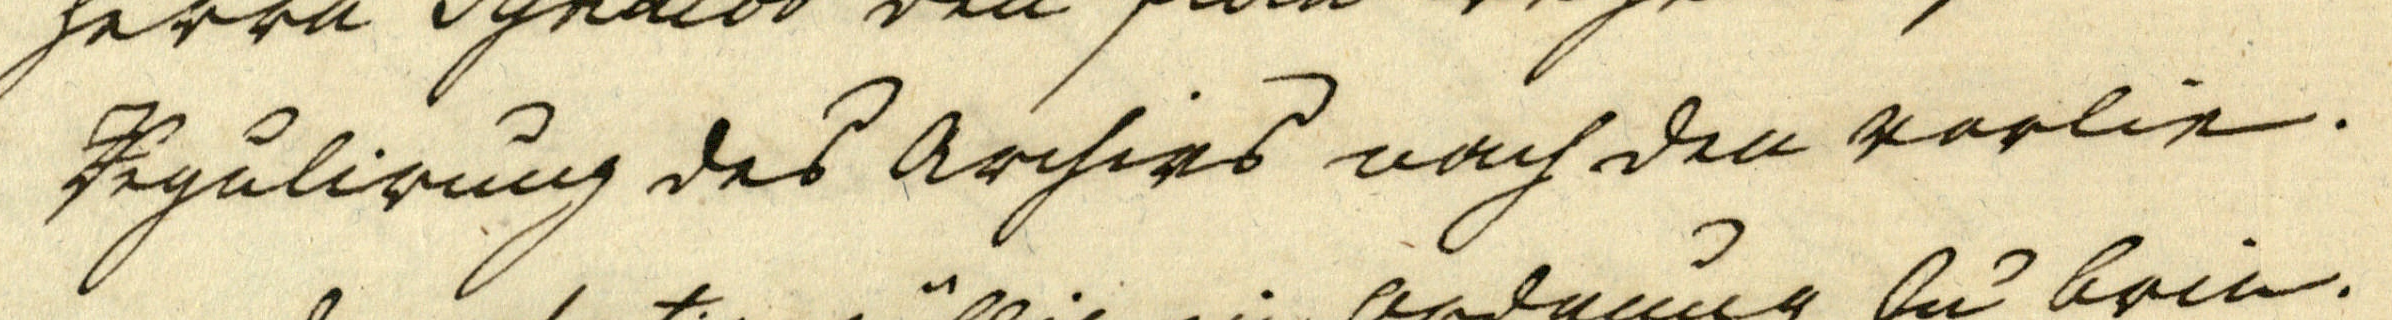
Regulirung des Archivs nach den vorlie¬
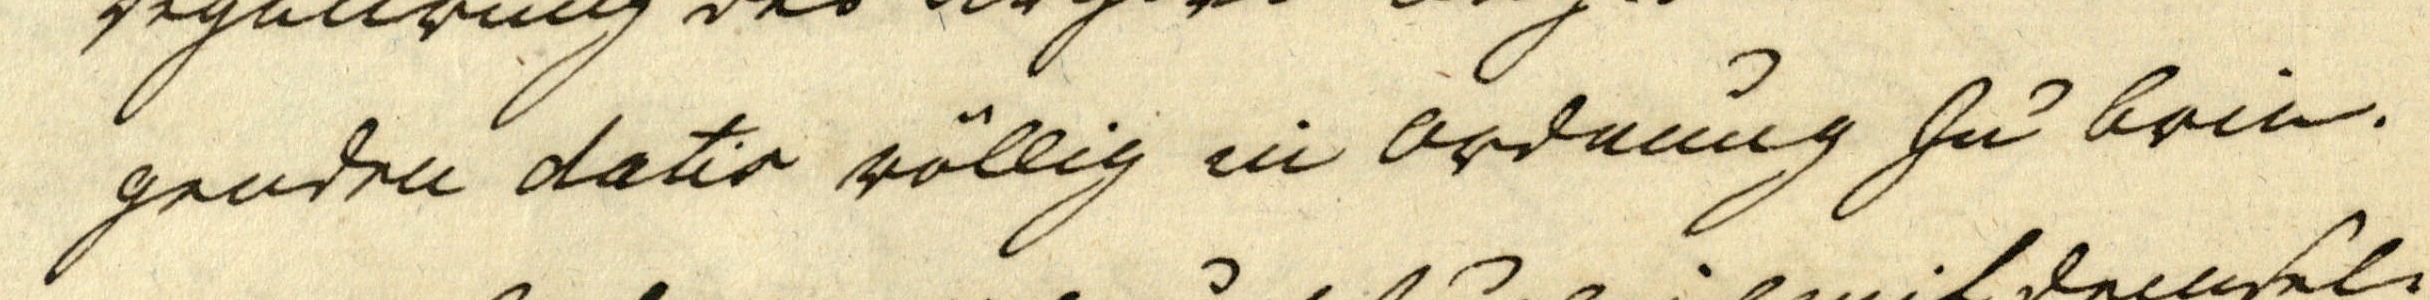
genden datis völlig in Ordnung zu brin¬
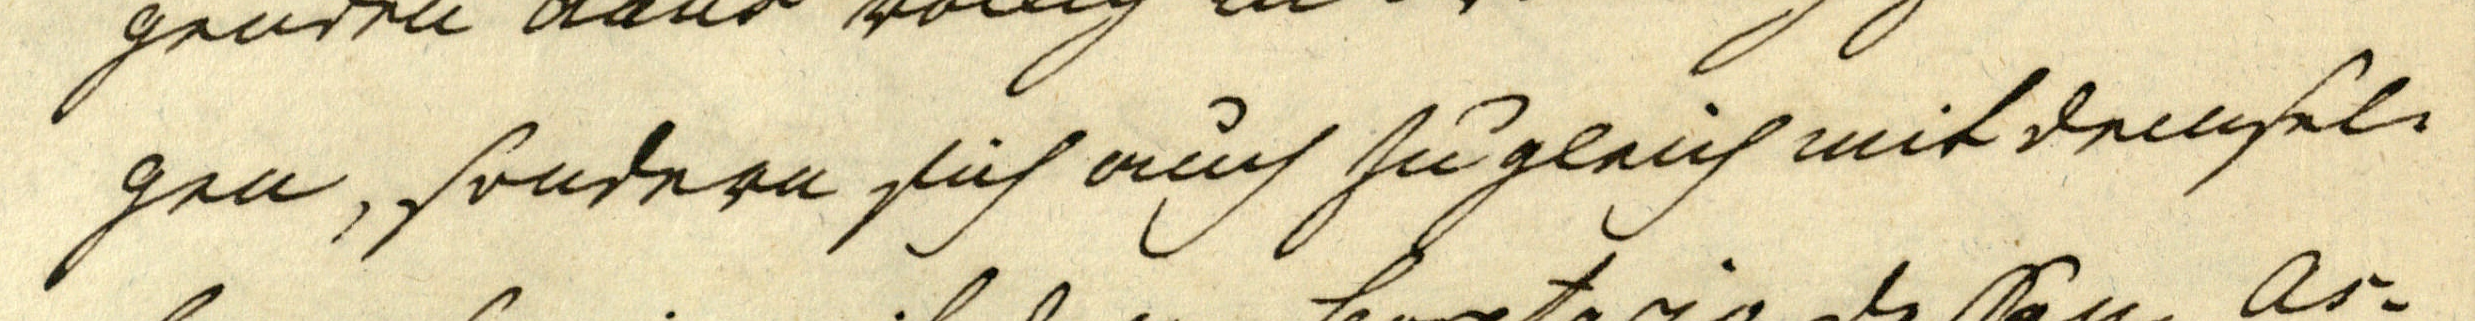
gen, sondern sich auch zugleich mit demsel¬
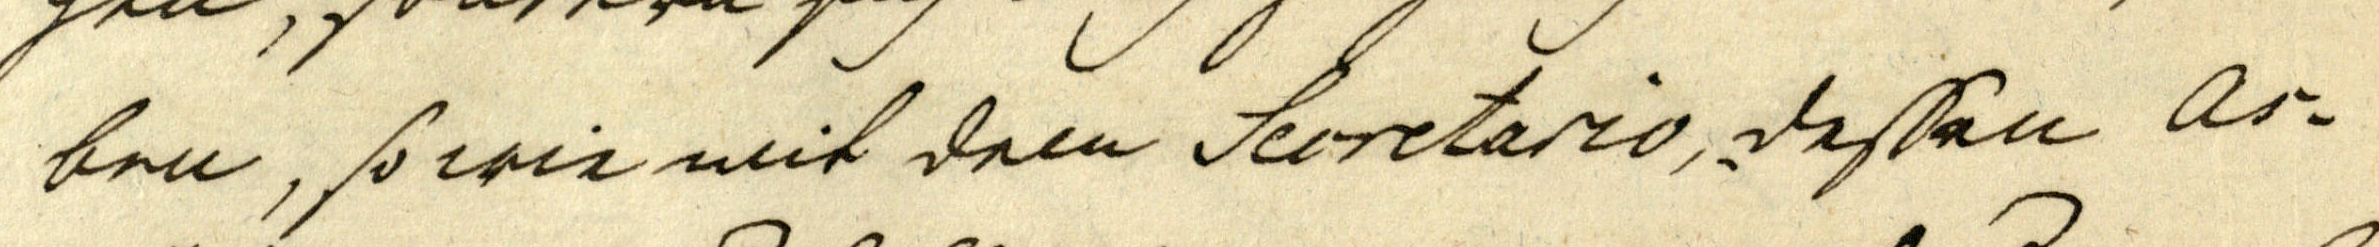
ben, so wie mit dem Secretario, dessen As¬
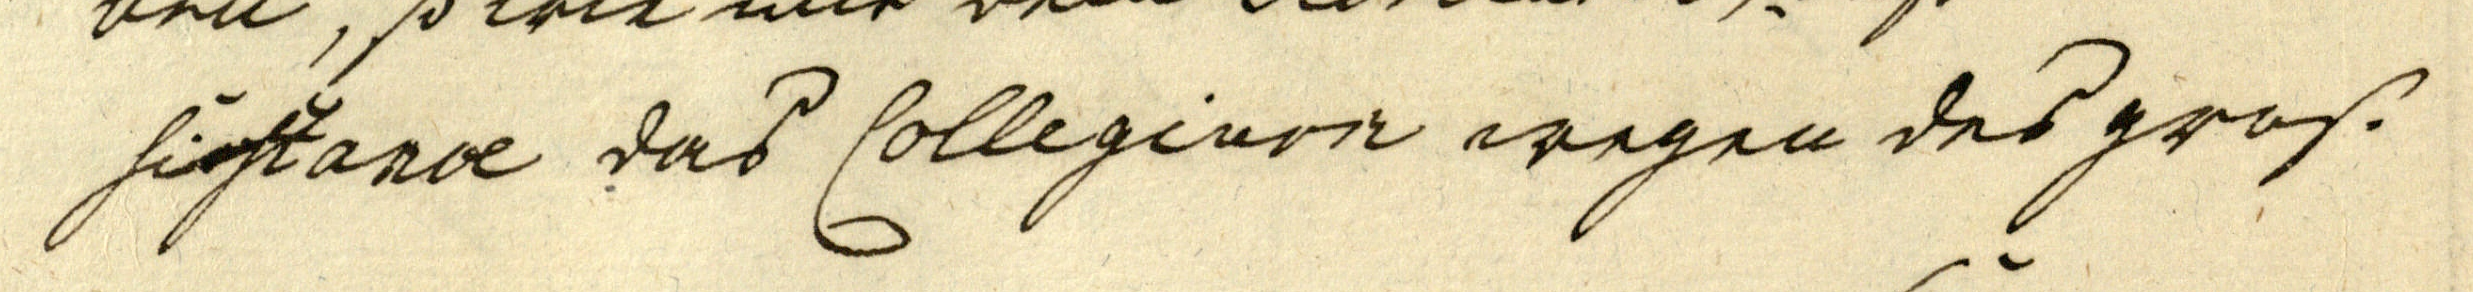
sistance das Collegium wegen des gros¬
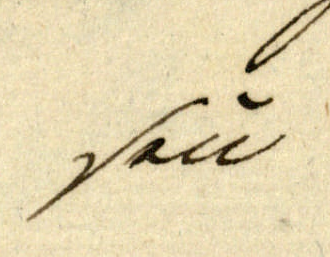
sen
